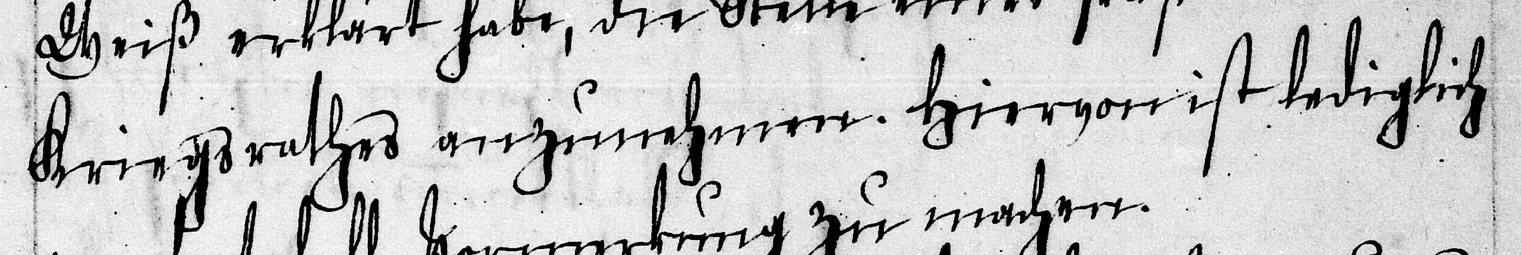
Kriegsrathes anzunehmen. Hiervon ist lediglich
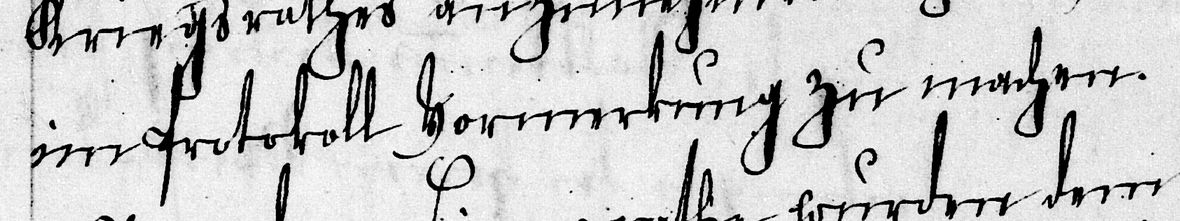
im Protokoll Vormerkung zu machen.
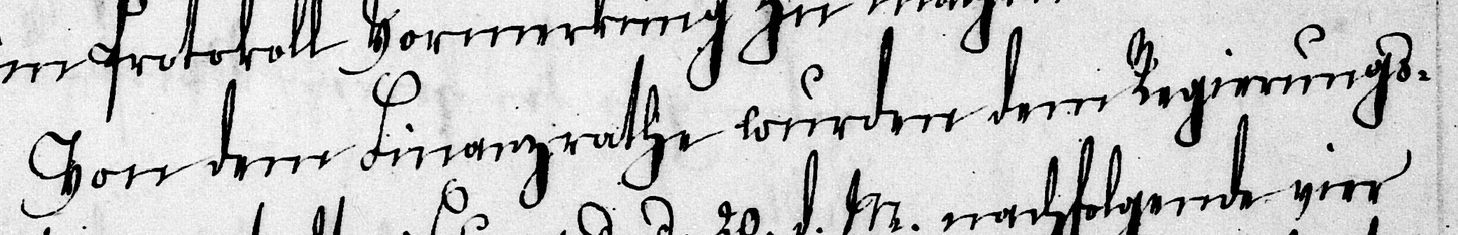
Von dem Finanzrathe wurden dem Regierungs¬
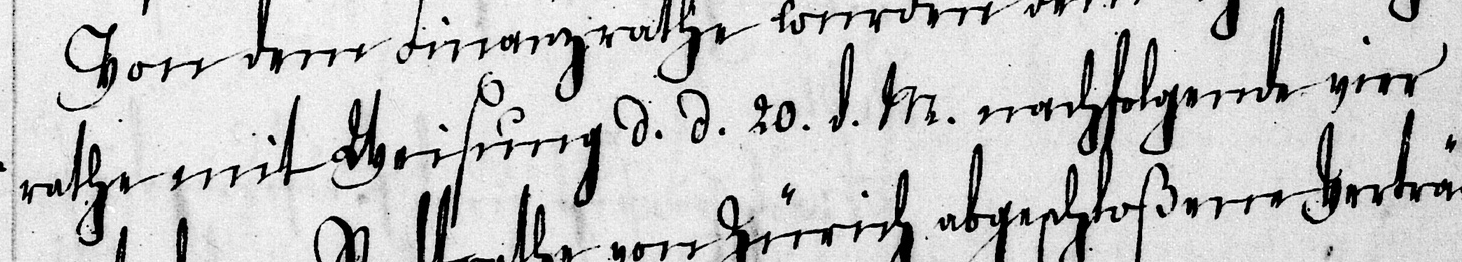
rathe mit Weisung d. d. 20. d. M. nachfolgende vier
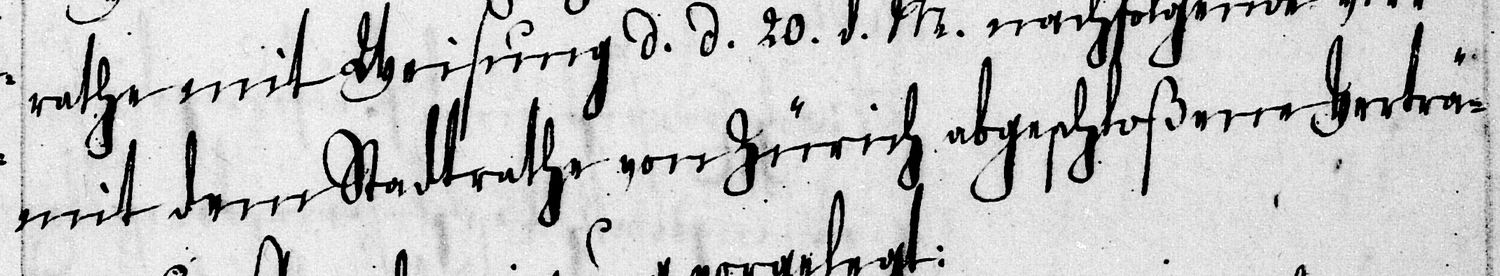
mit dem Stadtrathe von Zürich abgeschloßene Verträ¬
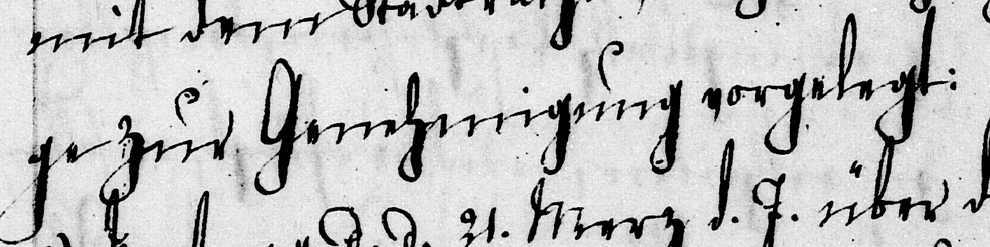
ge zur Genehmigung vorgelegt:
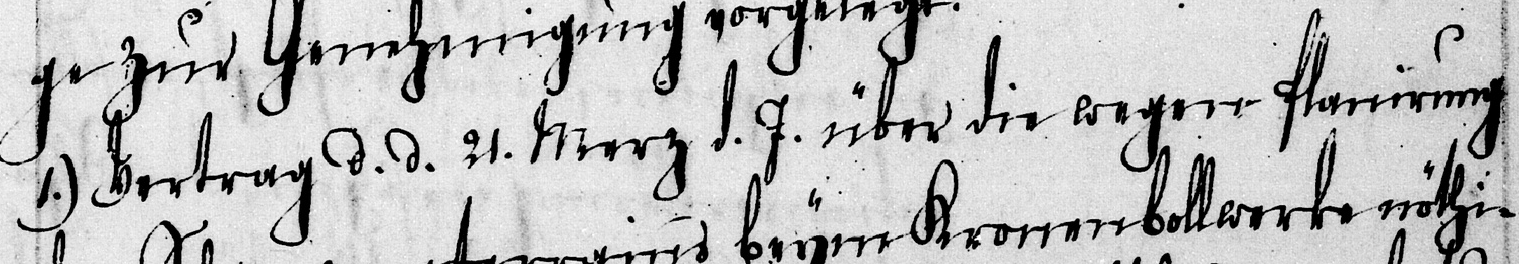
1.) Vertrag d. d. 21. Merz d. J. über die wegen Planirung
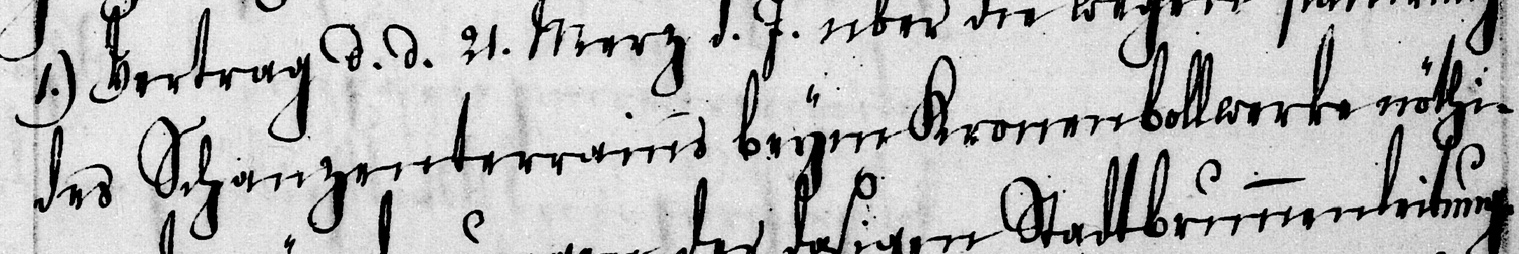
des Schanzenterrains beym Kronenbollwerke nöthi¬
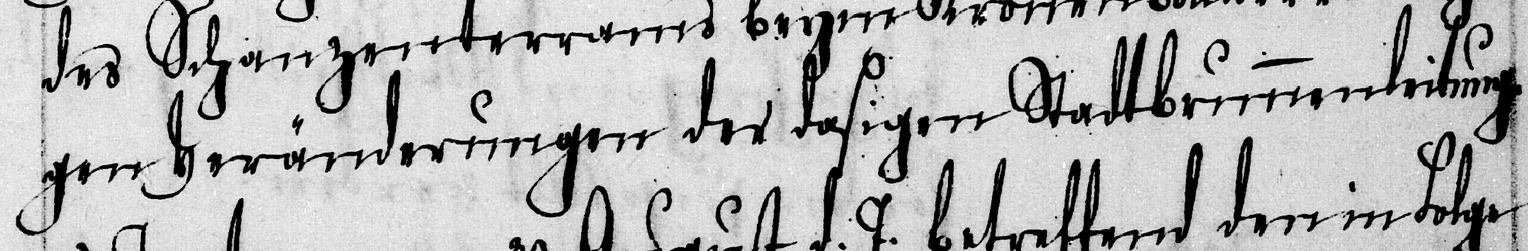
gen Veränderungen der dasigen Stadtbrunnenleitung.
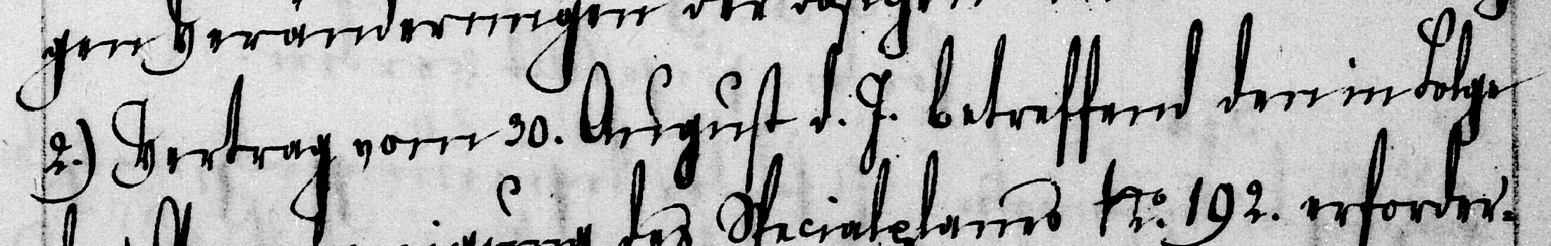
2.) Vertrag vom 30. August d. J. betreffend den in Folge
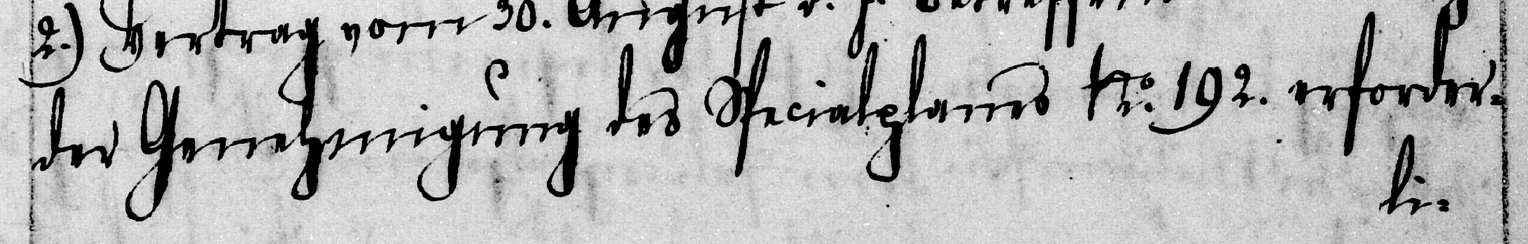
der Genehmigung des Specialplanes No. 192 erforder-
